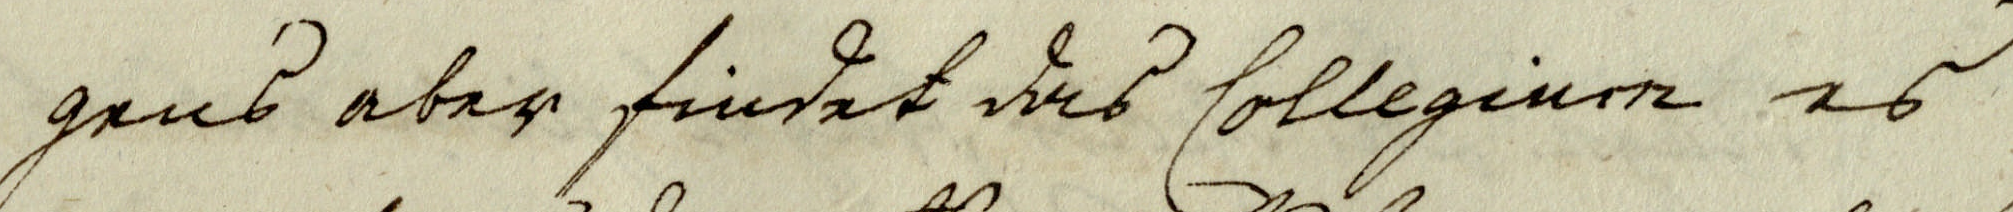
gens aber findet das Collegium es
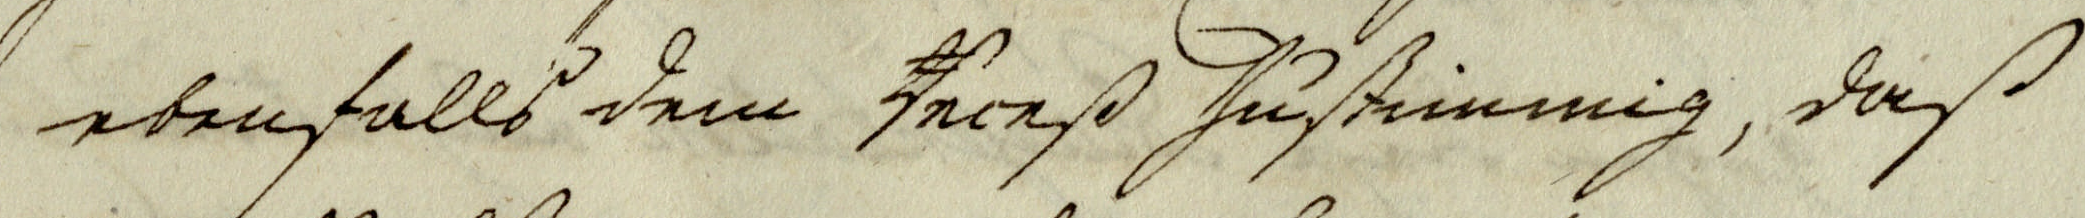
ebenfalls dem Receß zustimmig, daß
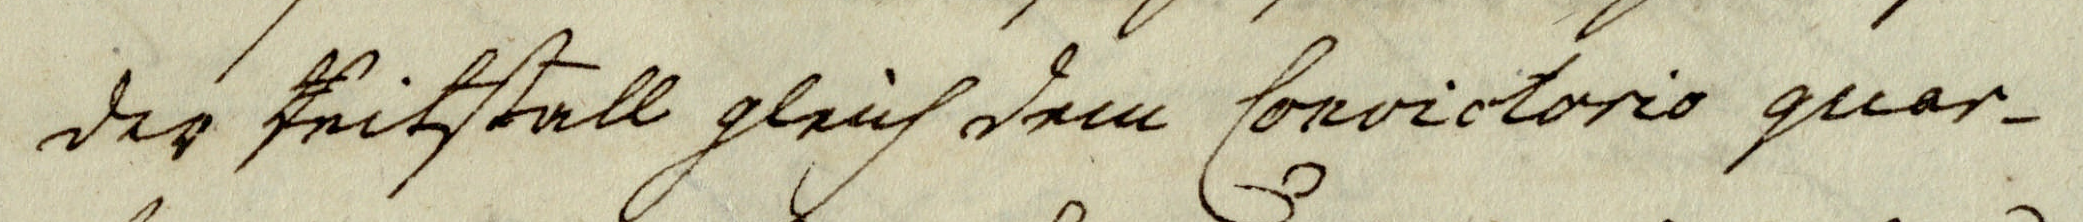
der Reitstall gleich dem Convictorio quar¬
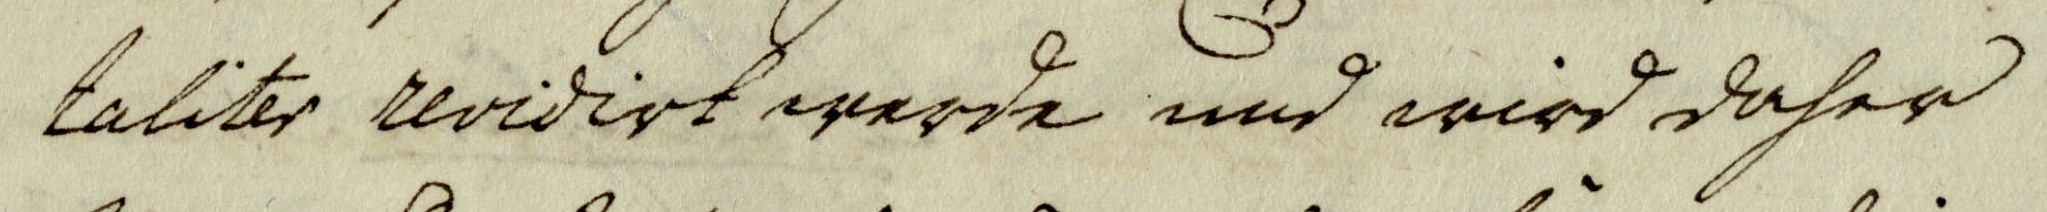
taliter revidirt werde und wird daher
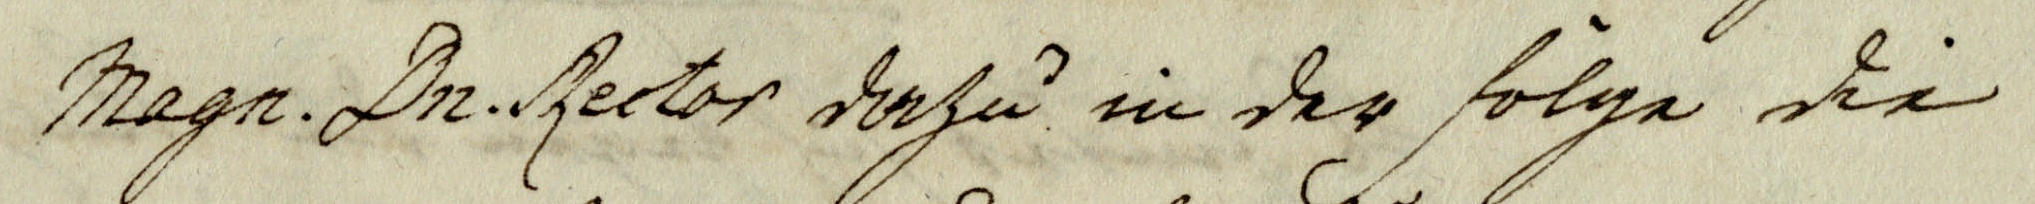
Magn. Dn. Rector dazu in der Folge die
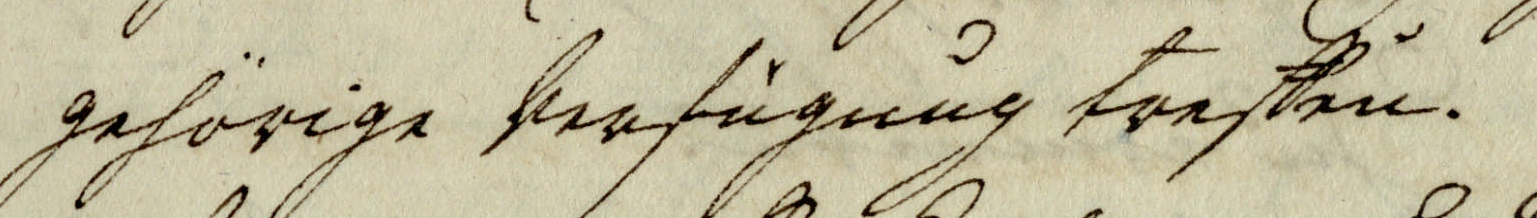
gehörige Verfügung treffen.
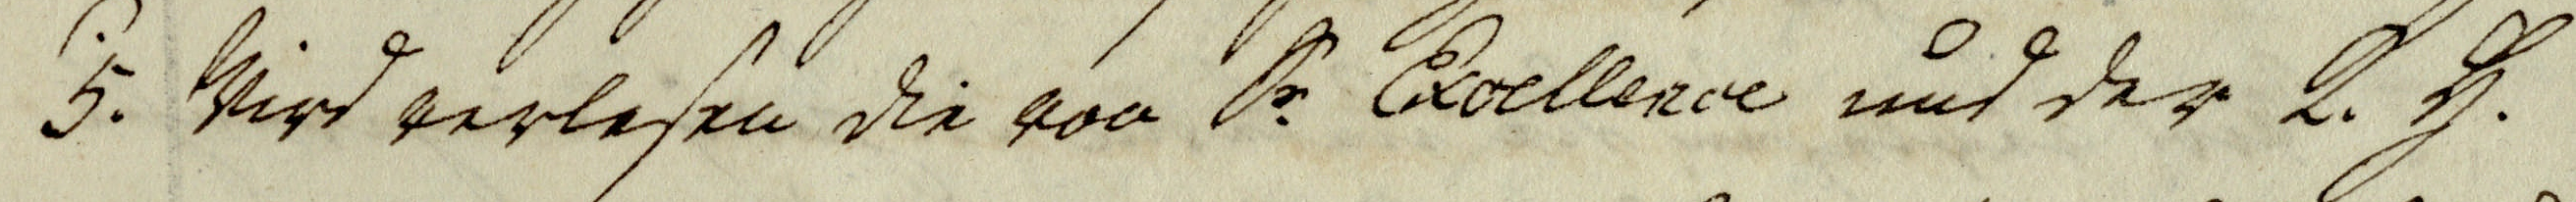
5. Wird verlesen die von Sr. Excellence und der K. H.
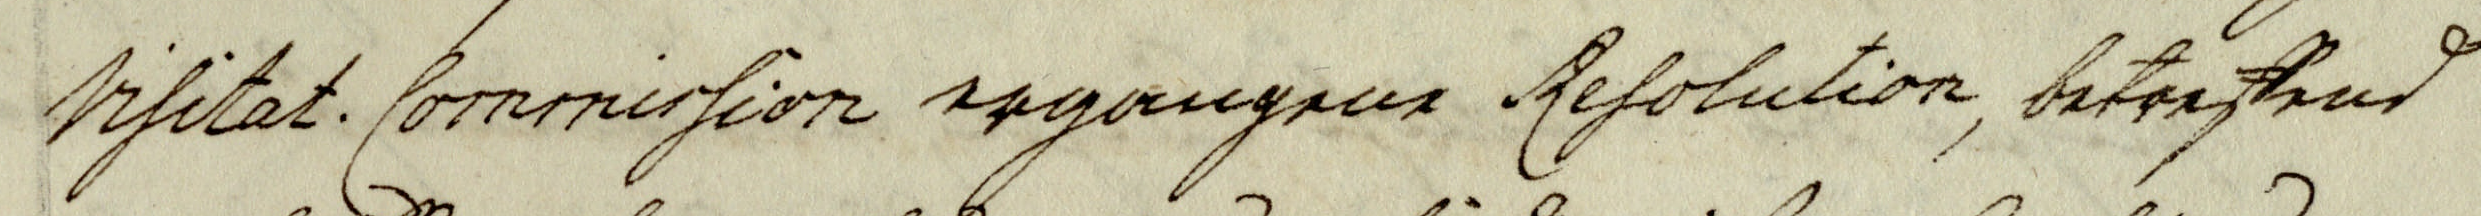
Visitat. Commission ergangene Resolution, betreffend
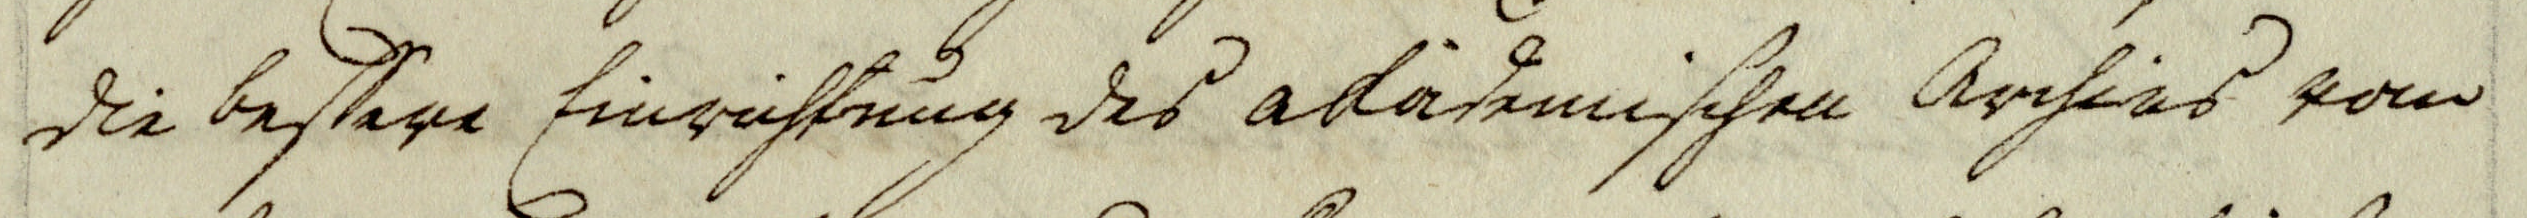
die bessere Einrichtung des akademischen Archivs vom
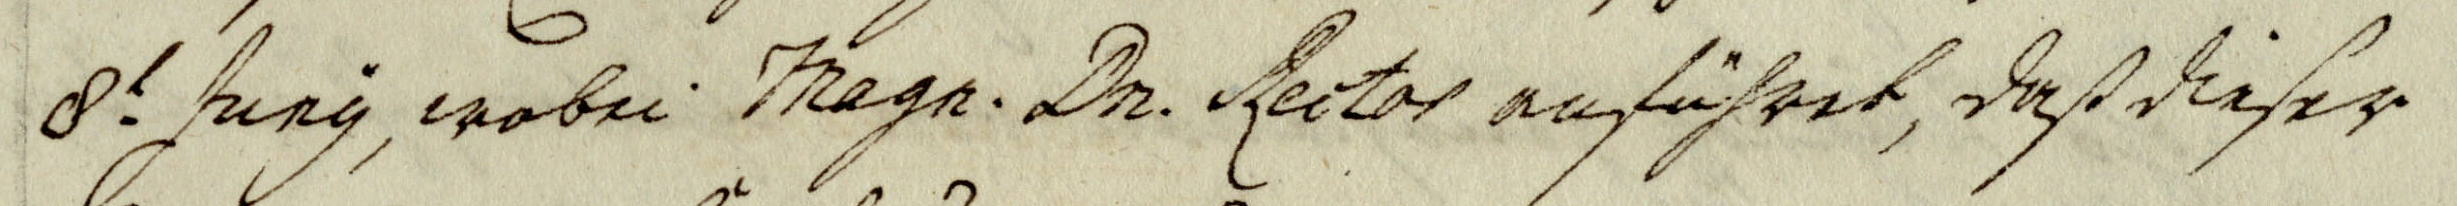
8t. Junÿ, wobei Magn. Dn. Rector anführet, daß dieser
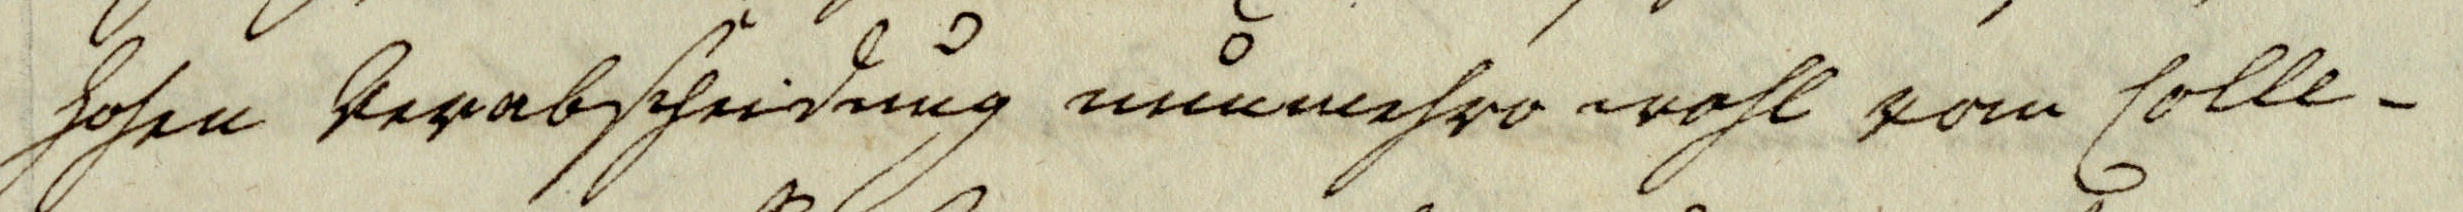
Hohen Verabscheidung nunmehr wohl vom Colle¬
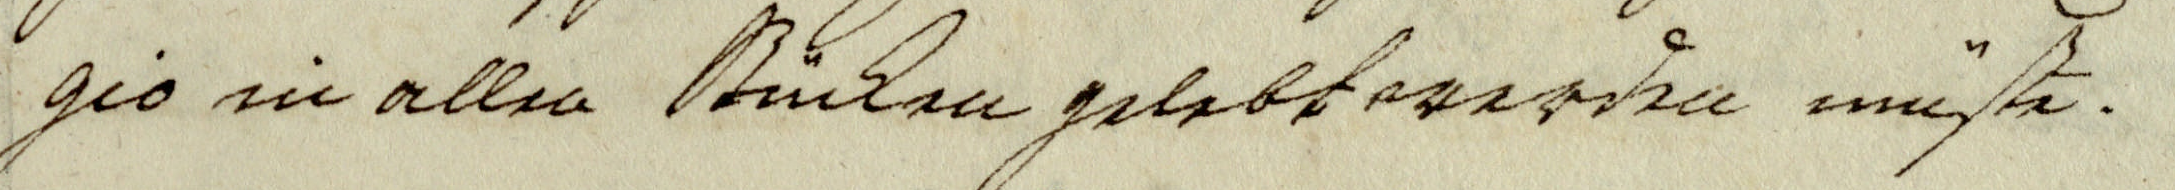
gio in allen Stücken gelebt werden müsste.
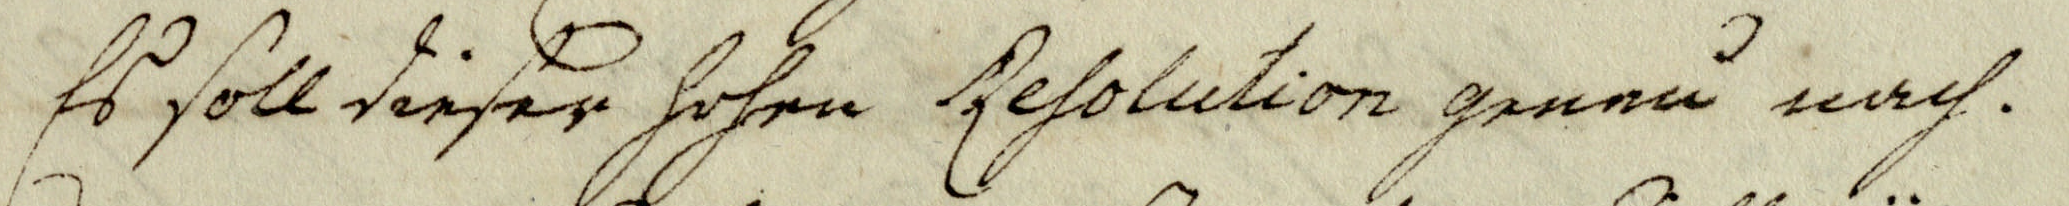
Es soll dieser Hohen Resolution genau nach¬
